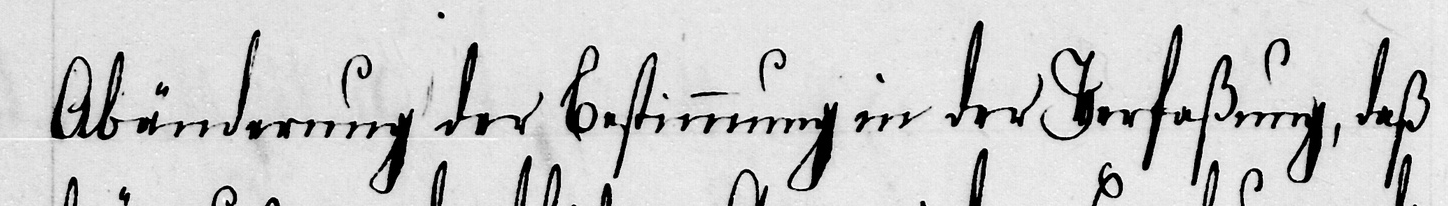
Abänderung der Bestimmung in der Verfaßung, daß
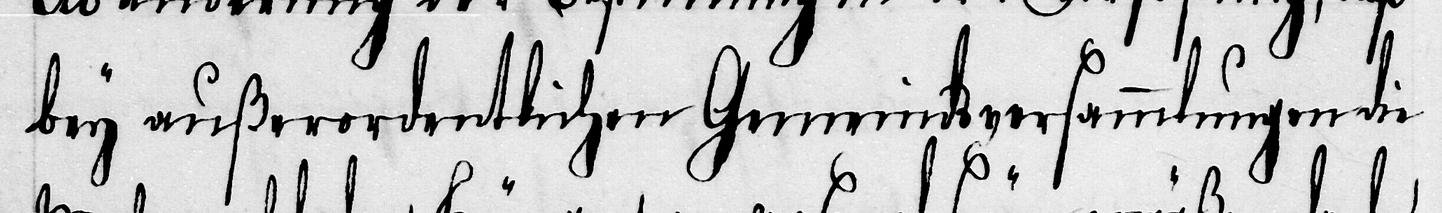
bey außerordentlichen Gemeindsversammlungen die
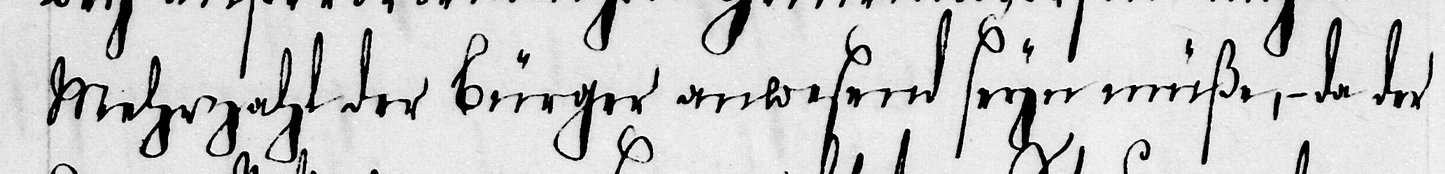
Mehrzahl der Bürger anwesend seyn müße, – da der
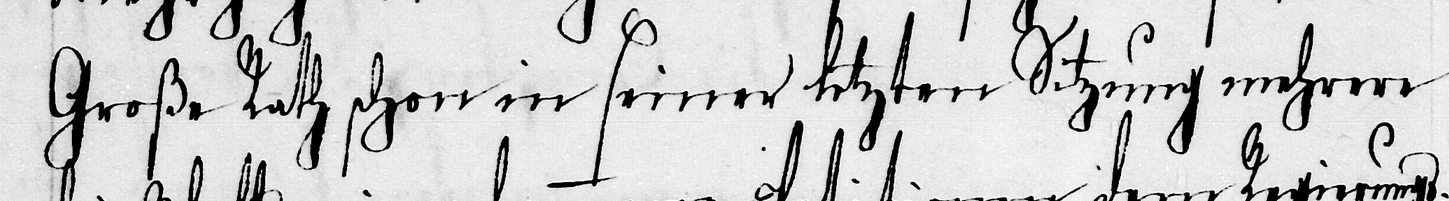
Große Rath schon in seiner letzten Sitzung mehrere
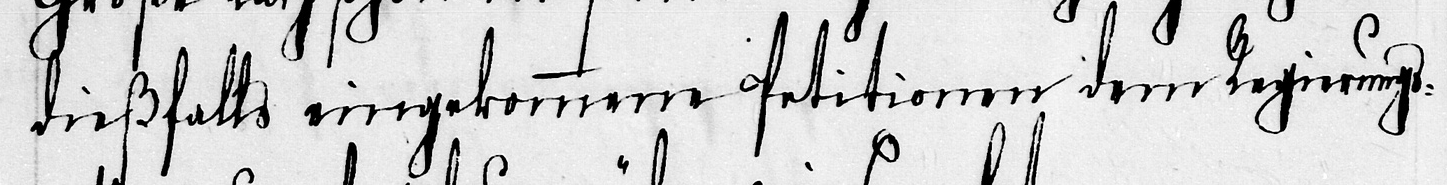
dießfalls eingekommene Petitionen dem Regierung¬
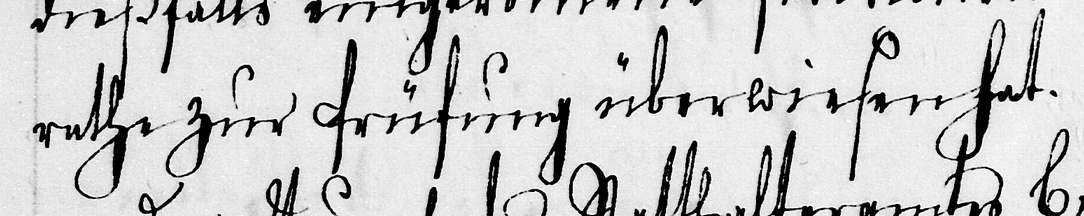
srathe zur Prüfung überwiesen hat.
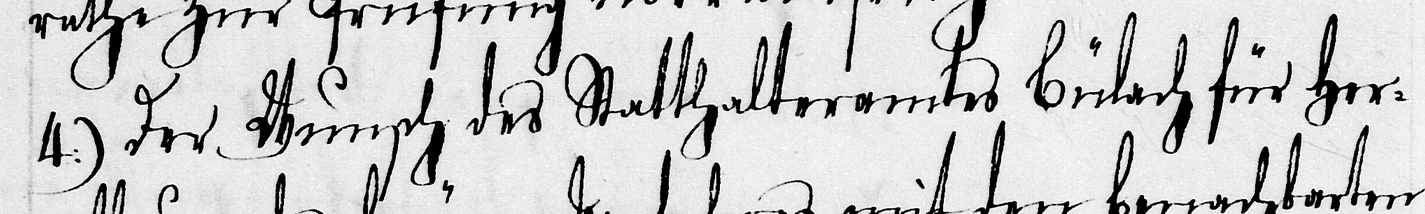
4.) Der Wunsch des Statthalteramtes Bülach für Her¬
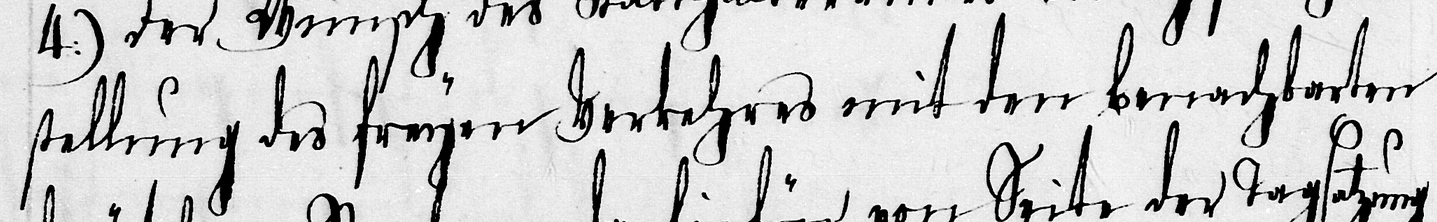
stellung des freyen Verkehres mit den benachbarten
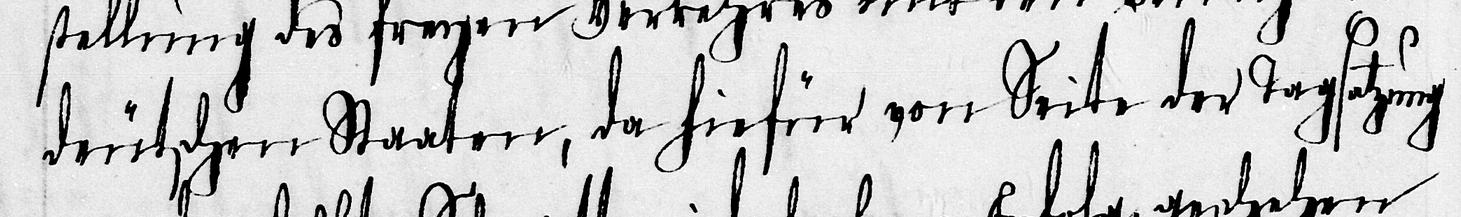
deutschen Staaten, da hiefür von Seite der Tagsatzung
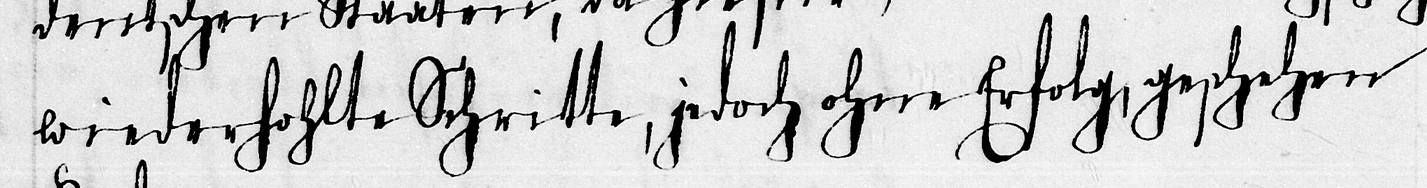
wiederhohlte Schritte, jedoch ohne Erfolg, geschehen
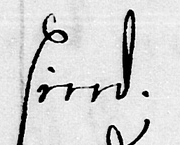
sind.
